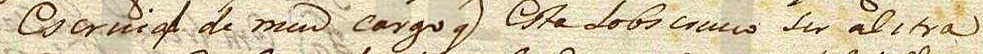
Escriuaõ de meu cargo q̄ Esta sobscreueo ser a letra
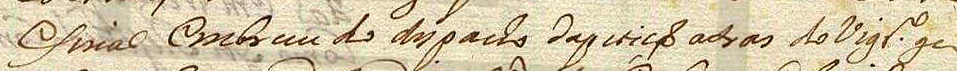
e sinal Em breue do dispacho da petiçaõ atras do Vigr.o ge
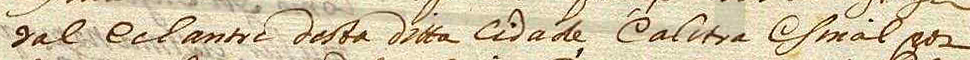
ral e chantre desta ditta cidade e a letra e sinal pos
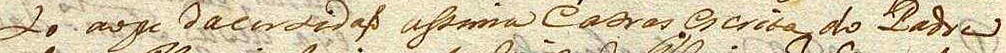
to ao pe da certidaõ assima e atras escrita do Padre
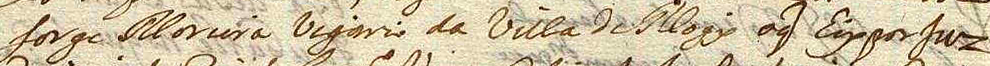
Jorge Moreira vigario da Villa de Mogy o q̄ hey por Juz
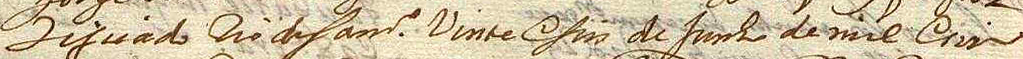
tificado Rio de Janr.o Vinte e seis de Junho de mil e seis
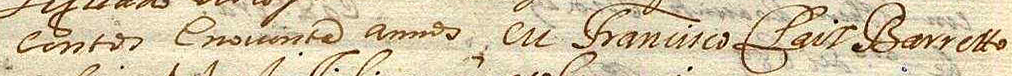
centos e nouenta annos, eu Francisco Paiz Barretto
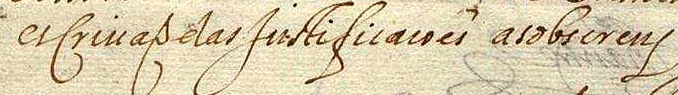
esCriuaõ das Justificaçoẽs a sobscreuj
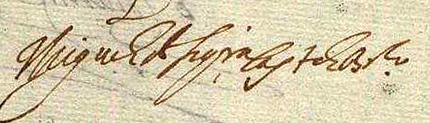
Miguel de siq.ra Castel Br.co
